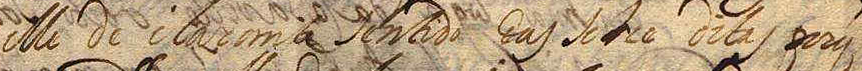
elle declarante sentido das sobreditas porq̄
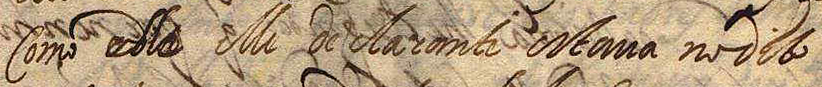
Como elle elle declarante estaua no dito
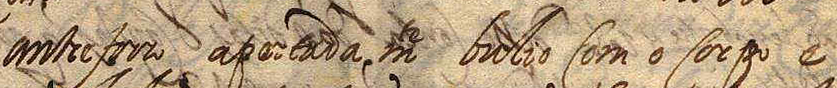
antreforro apertadamte bulio Com o Corpo e
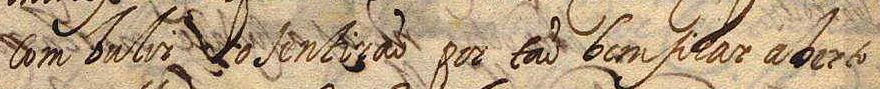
com bulir o sentirão por taõbem ficar aberto
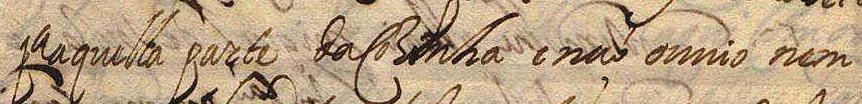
pa aquella parte da Cozinha e não ouuio nem
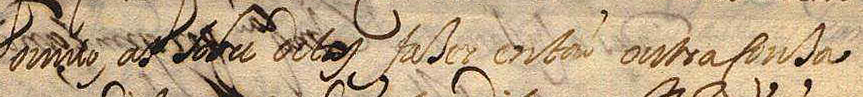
ouuio, as sobre ditas fazer entaõ outra Couza
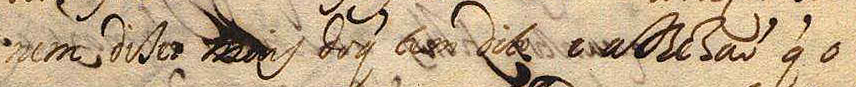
nem dizer mais do q̄ tem dito e a Rezaõ q̄ o
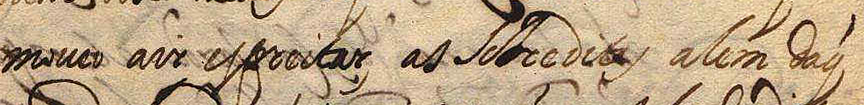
moueo a ir espreitar, as sobreditas alem da q̄
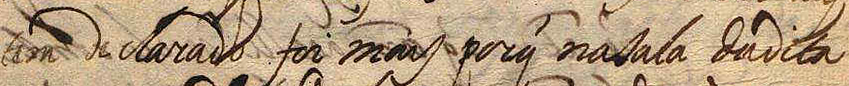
tem declarado foi mais porq̄ na sala da dita
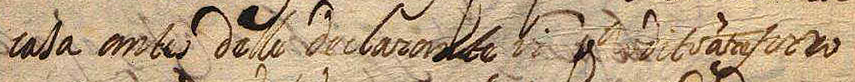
caza antes delle declarante ir pa o dito ātreforro
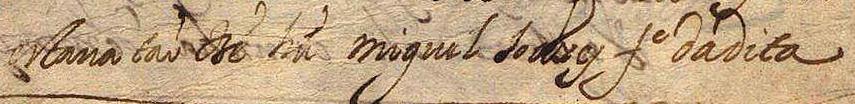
estaua taõBē hū miguel soares fo da dita
